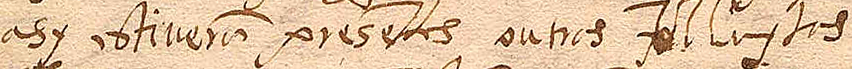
asy estiuera̅ pres̅etes outras J Muytas
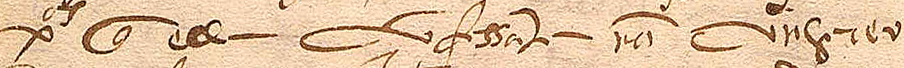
pas q̅ elle Cōfessāte n̅a Conheceo
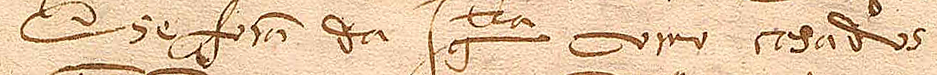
e se fora̅ da Jgra Como casados
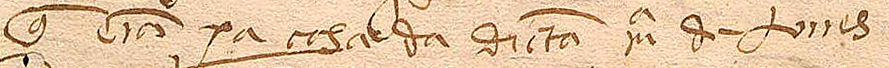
q̅ e̅ra ꝑa casa da dīcta ma de torres
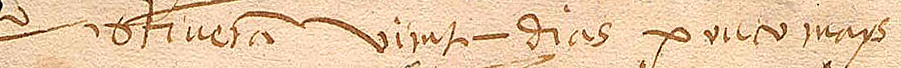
e estiuer̅a vimte dias pouco mays
